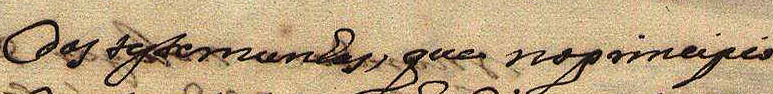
das testemunhas, que no principio
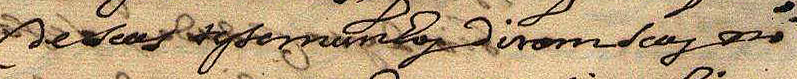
de seus testemunhos diram seus no
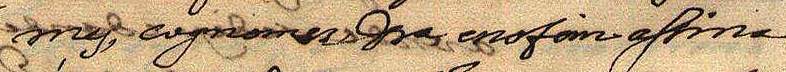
mes, cognomez &ra e no fim assina
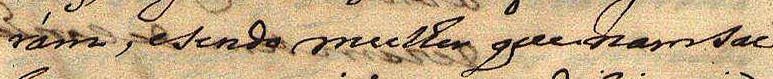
rám, e sendo mulher que nam sai
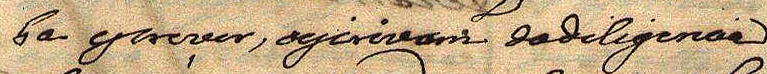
ba escrever, o escrivam da diligencia
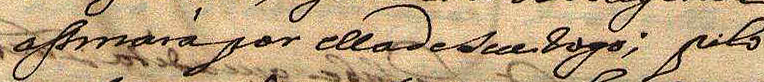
assinará por ella de seu Rogo; pelo
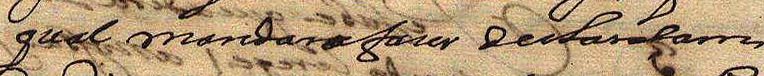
qual mandara fazer declaraçam
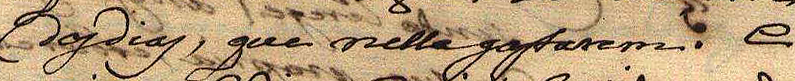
dos dias, que nella gastarem. E
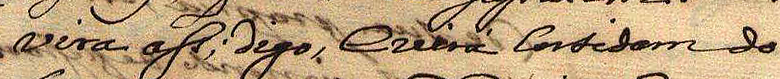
vira assi digo, e virá Certidam do
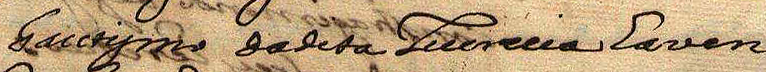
bautismo da dita Lucrecia haven
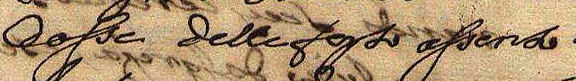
dosse delle feyto assento.
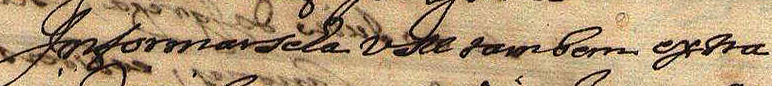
Jnformarseha VM tambem extra
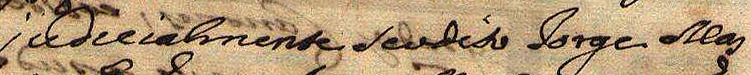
judicialmente se o dito Iorge Mas
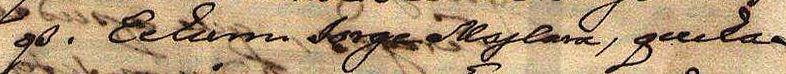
qs. he hum Iorge Mascara, que ha
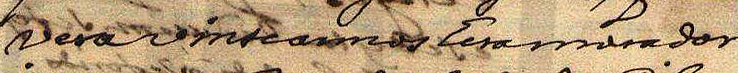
vera vinte annos hera morador
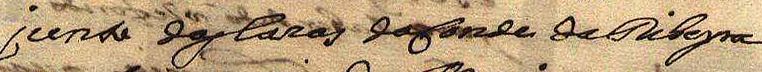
junto das Cazas do Conde da Ribeyra
